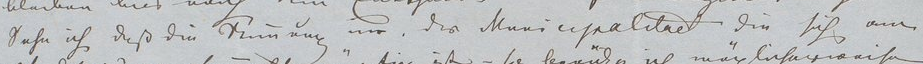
Sehe ich daß die Stimmung in – der Municipalilaet die sich am
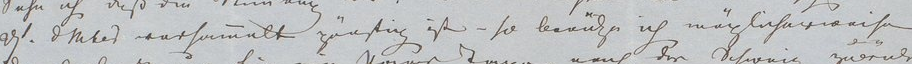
27t dMts versammelt günstig ist – so benütze ich möglicherweise
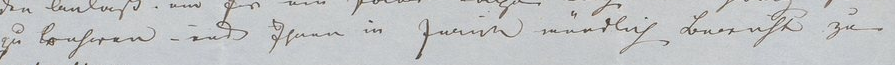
zu kehren – und Ihnen in Zürich mündlich Bericht zu
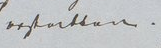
erstatten.
